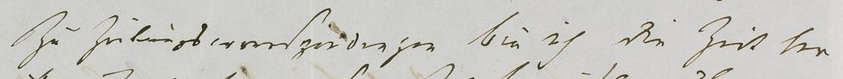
Zu Zeitungscorrespondenzen bin ich die Zeit her
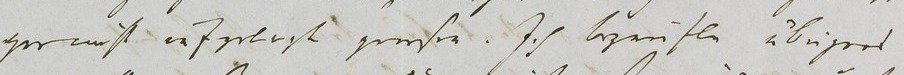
gar nicht aufgelegt gewesen. Ich bezweifle übrigens
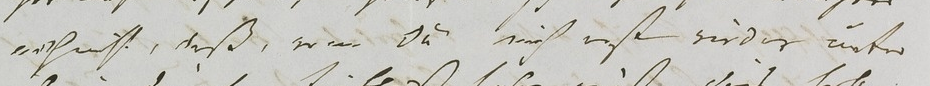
auch nicht, daß, wenn Du mich erst wieder unter
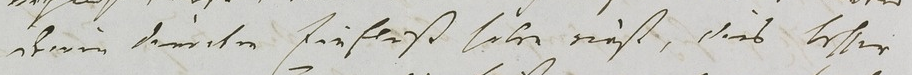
Deinen directen Einfluß haben wirst, dies besser
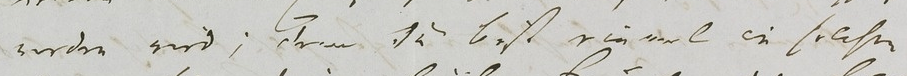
werden wird; denn Du bist einmal in solchen
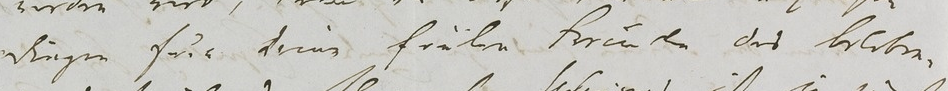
Dingen für Deine faulen Freunde das beleben-
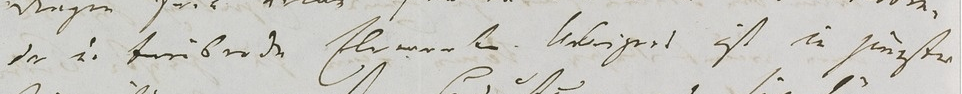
de u. treibende Element. Uebrigens ist in jüngster
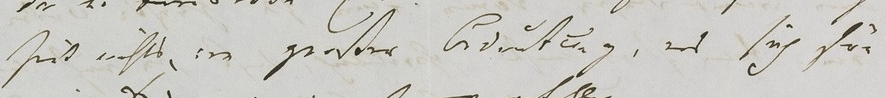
Zeit nichts von großer Bedeutung, was sich für
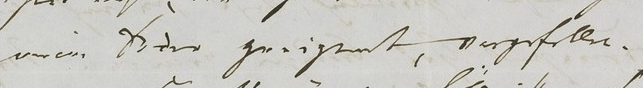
meine Feder geeignet, vorgefallen.
